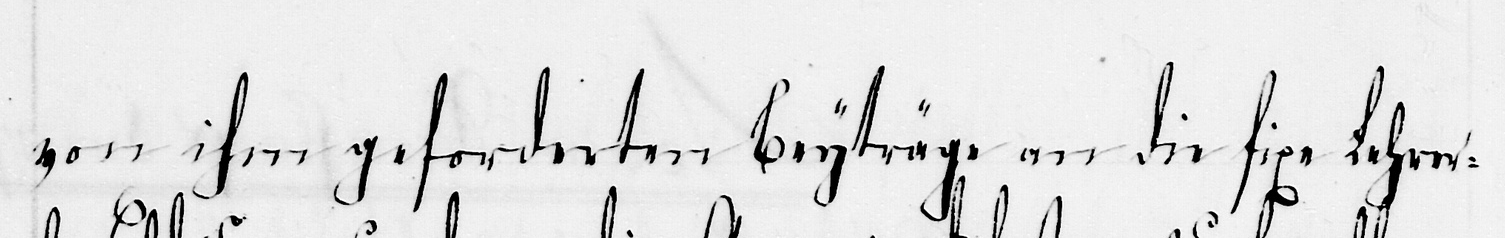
von ihm geforderten Beyträge an die fixe Lehre¬
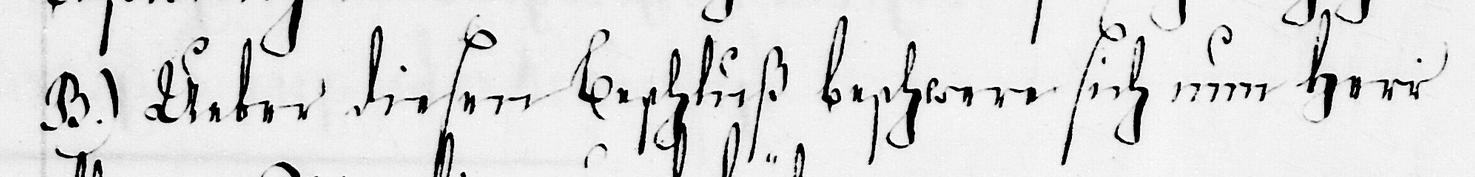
B.) Ueber diesen Beschluß beschwere sich nun Herr
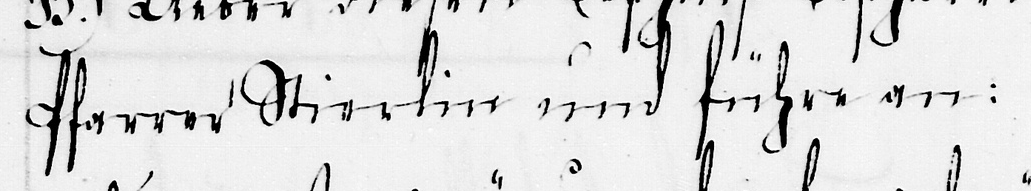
Pfarrer Stierlin und führe an:
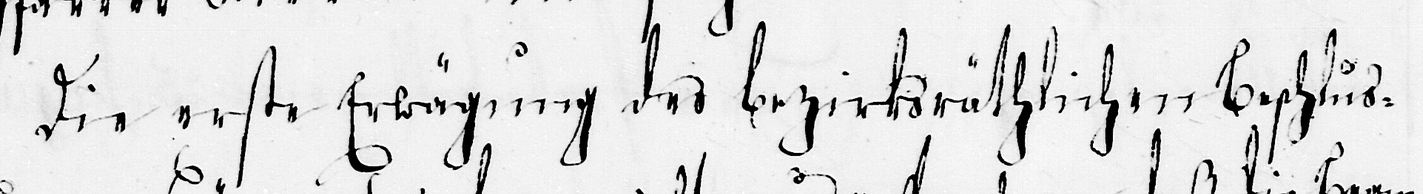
Die erste Erwägung des bezirksräthlichen Beschluß¬
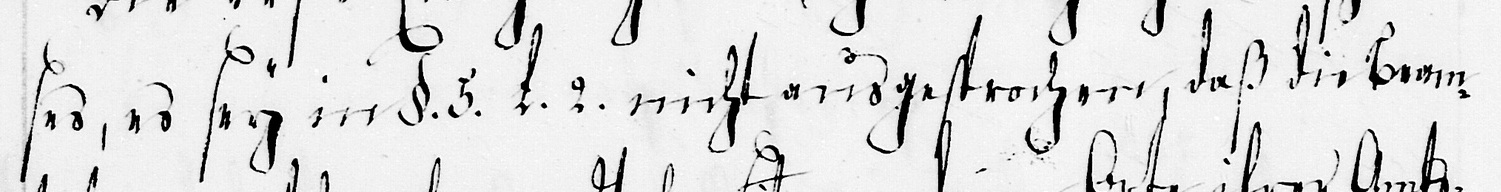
es, es sey in §. 5. L. 2. nicht ausgesprochen, daß die Beam¬
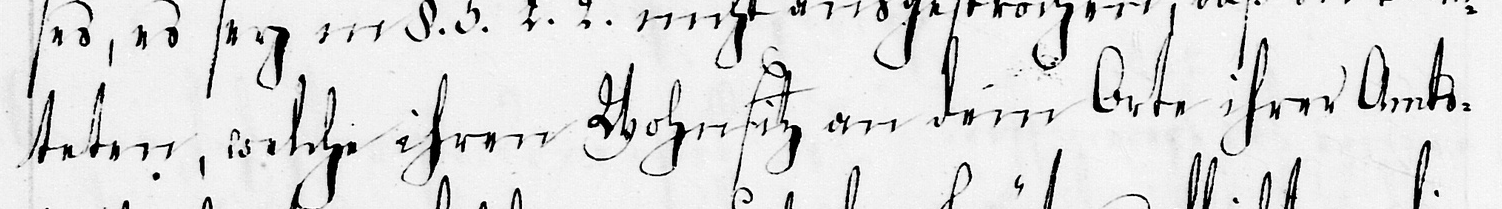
teten, welche ihren Wohnsitz an dem Orte ihrer Amts¬
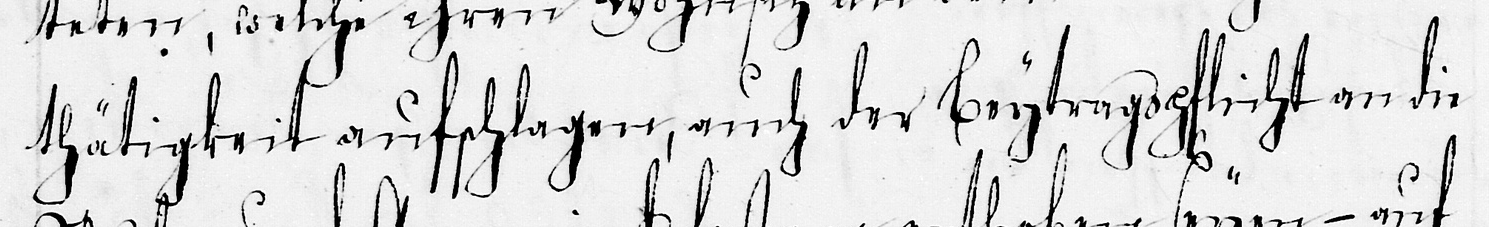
thätigkeit aufschlagen, auch der Beytragspflicht an die
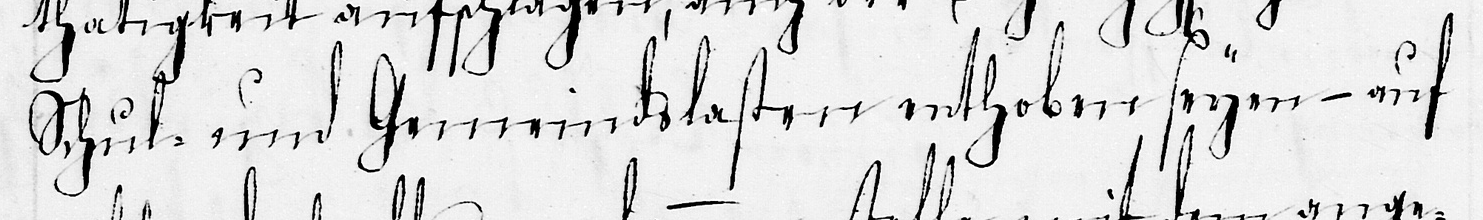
Schul- und Gemeindslasten enthoben seyen – auf
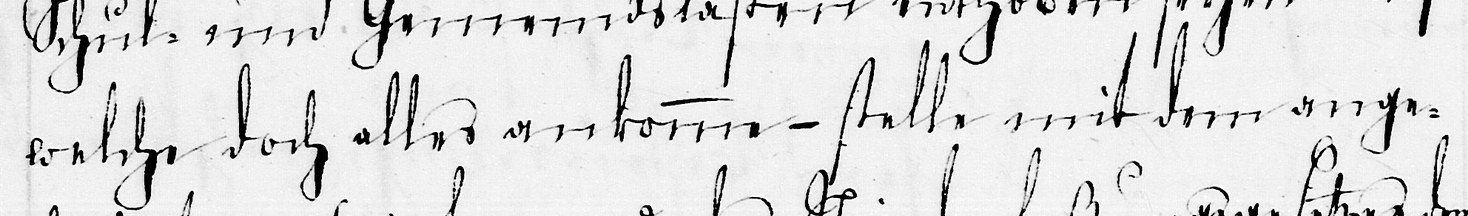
welche doch alles ankomme – stelle mit dem ange¬
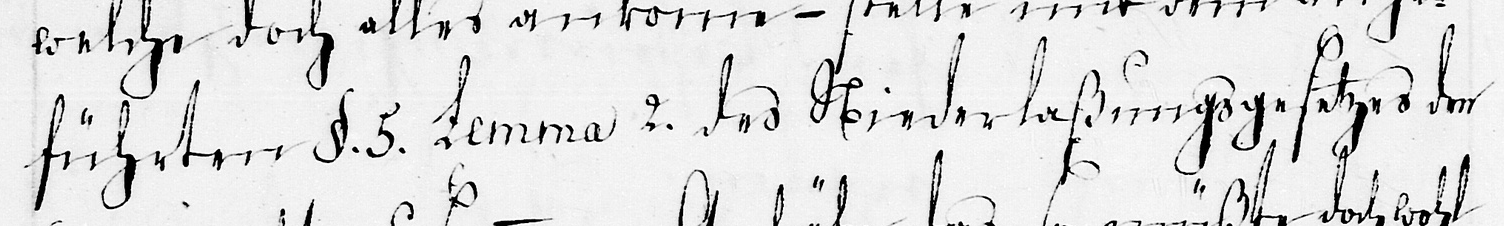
führten §. 5. Lemma 2. des Niederlaßungsgesetzes den
